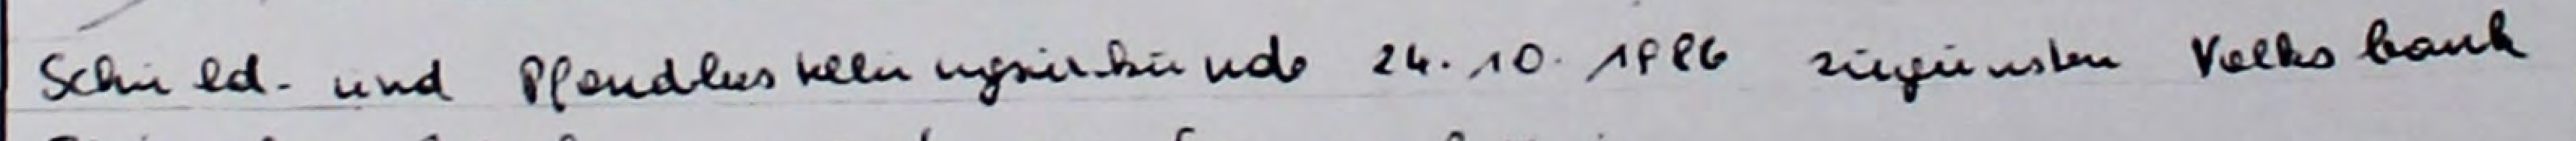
Schuld- und Pfandbestellungenkunde 24.10.1986 zugunsten Volksbank
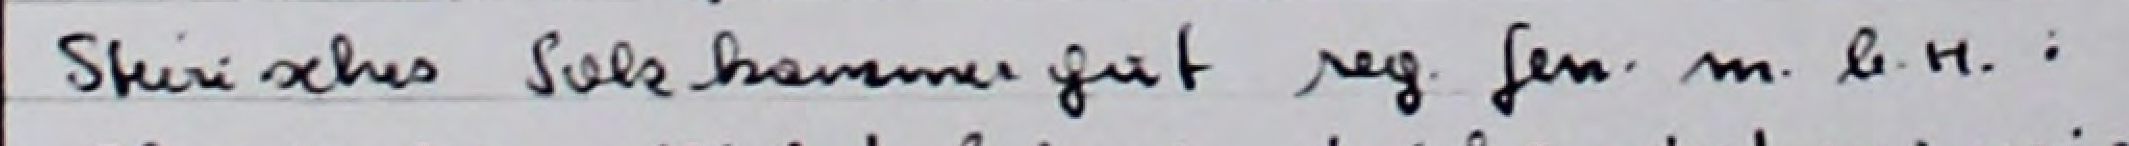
Steirisches Salzkammergut reg. Gen. m. C. H.:
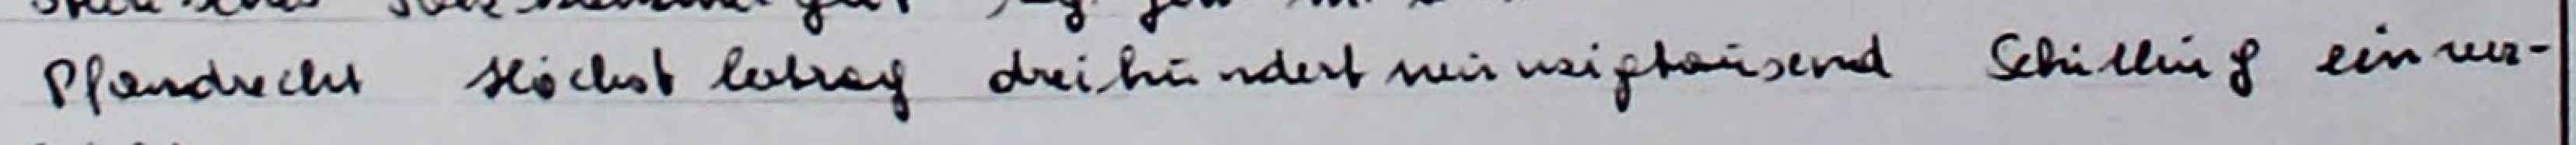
Pfandrecht Höchstbetrag dreihundertneunzigtausend Schilling einver-
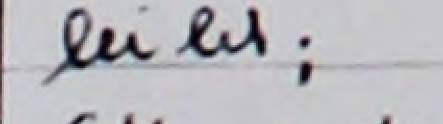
leibt;
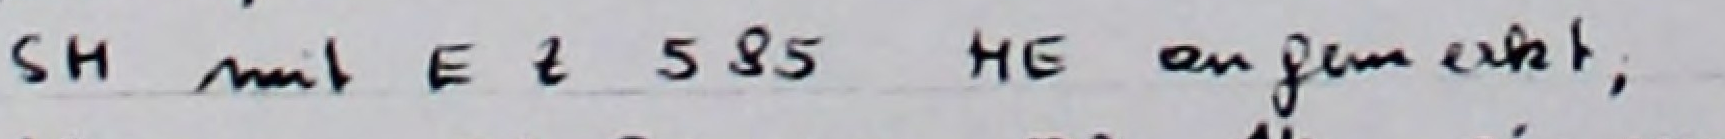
S H mit E Z 595 H E angemerkt;
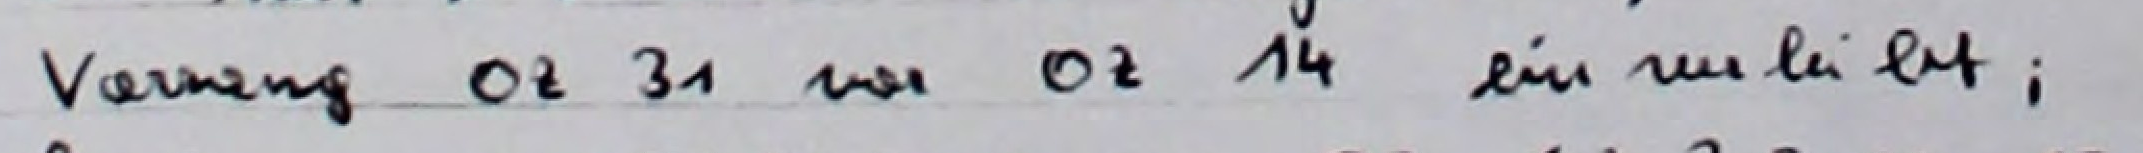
Vorrang OZ 31 vor OZ 14 einverleibt;
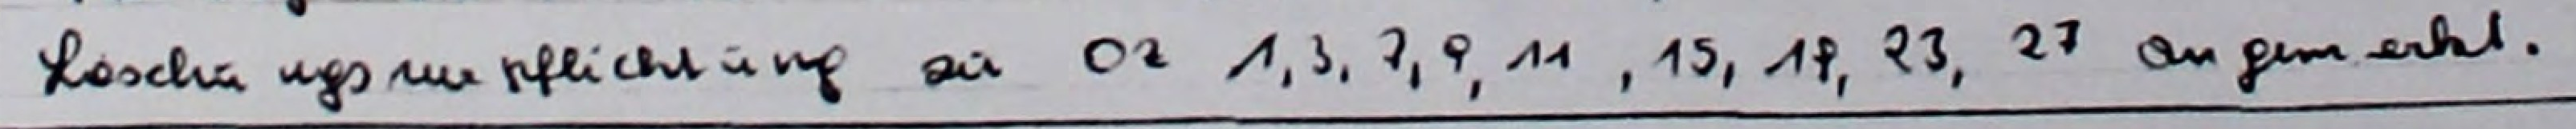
Löschungsverpflichtung zu OZ 1, 3, 7, 9, 11, 15, 19, 23, 27 angemerkt.
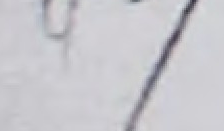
13
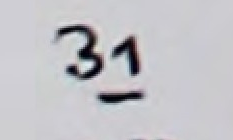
31
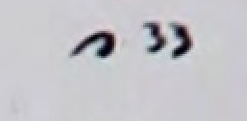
s 33
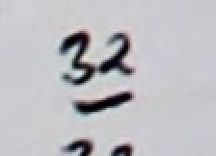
32
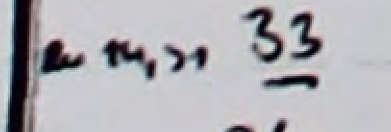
zu 14, 21 33
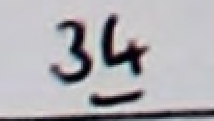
34
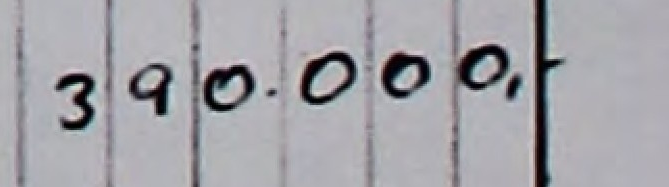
390.000.
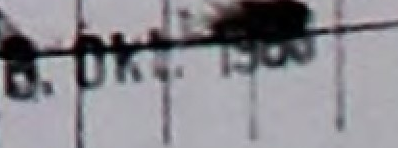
3. Okt. 1988
